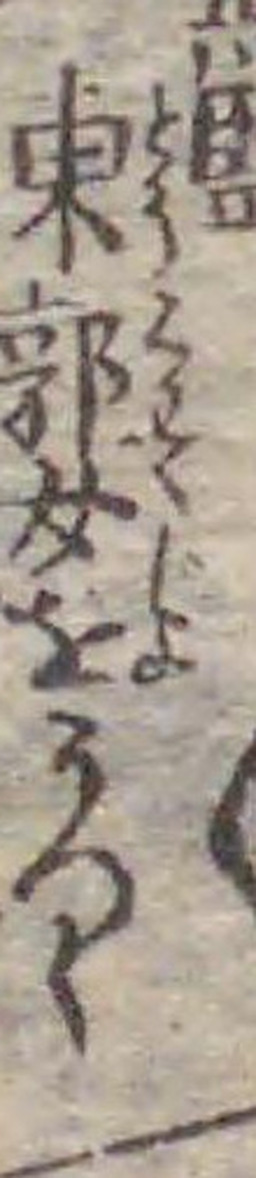東郭女をうつく
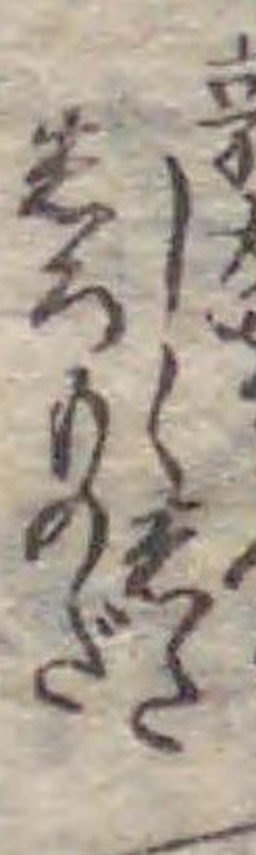しろものだ
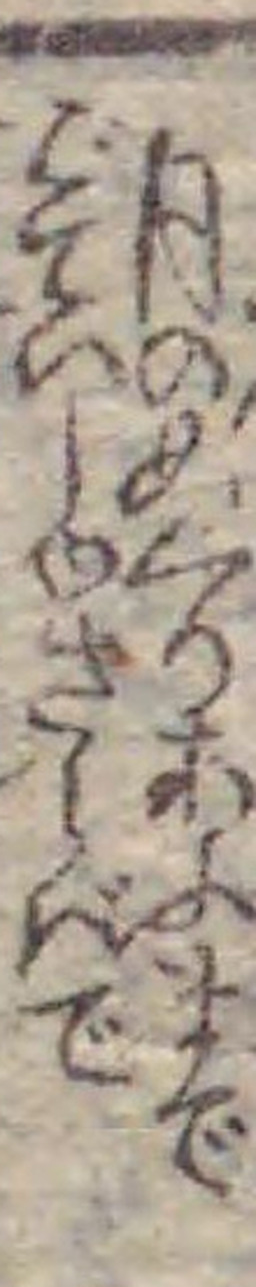ごていしゆさらばで
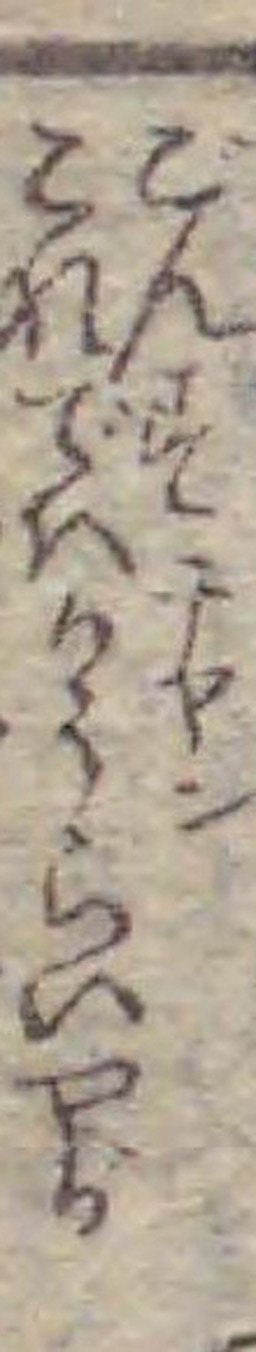これではかうらいやが
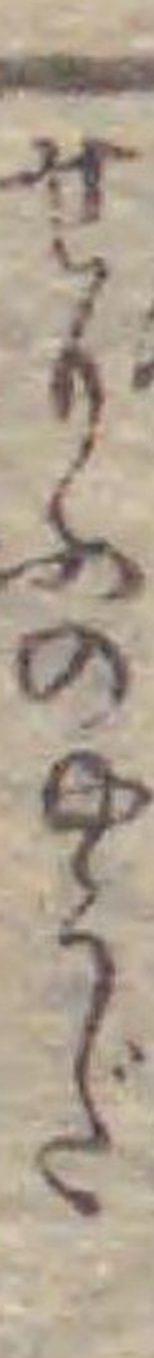せりふのやうだ

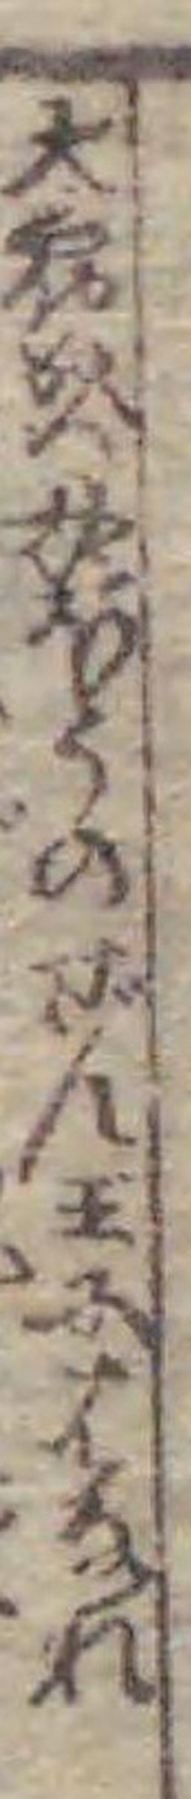太郎介は女ぼうのぜん玉にはなれ
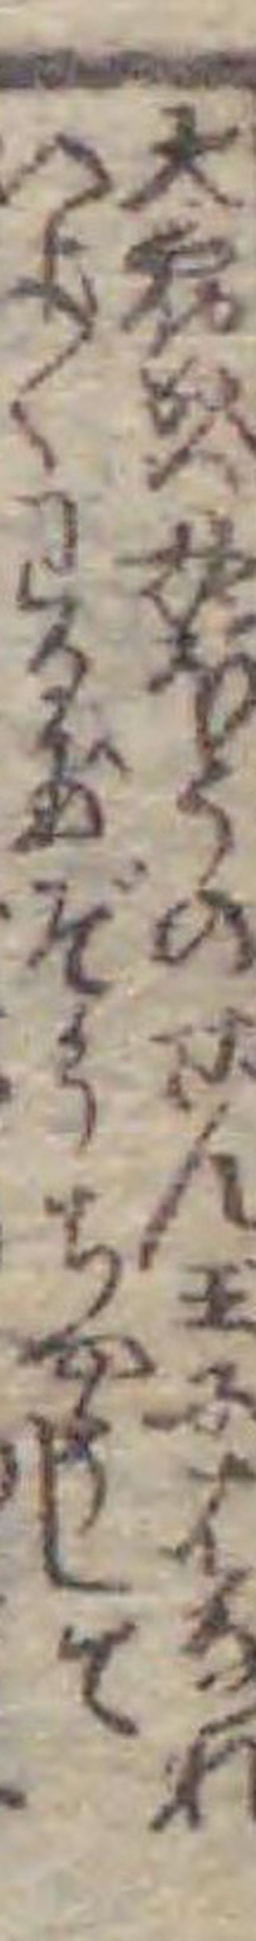いよ〳〵わる玉ぞうちやうして
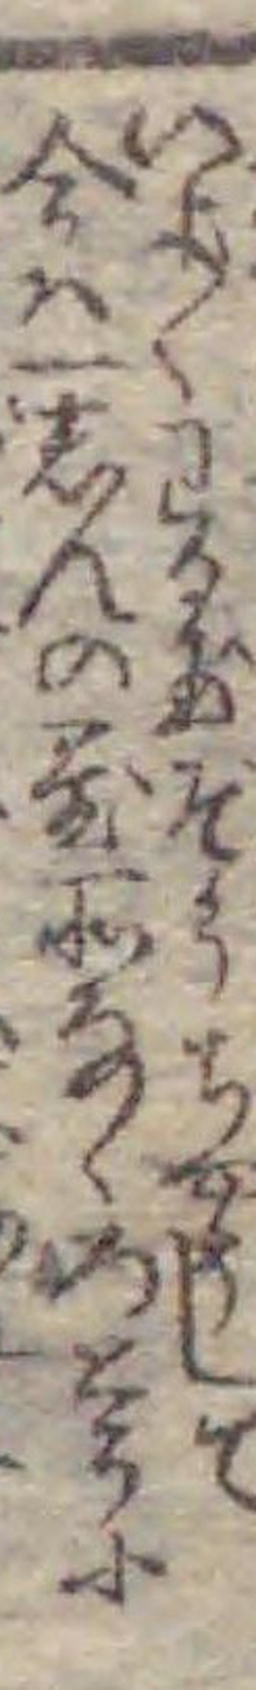今は一しんの置所なくろとうに
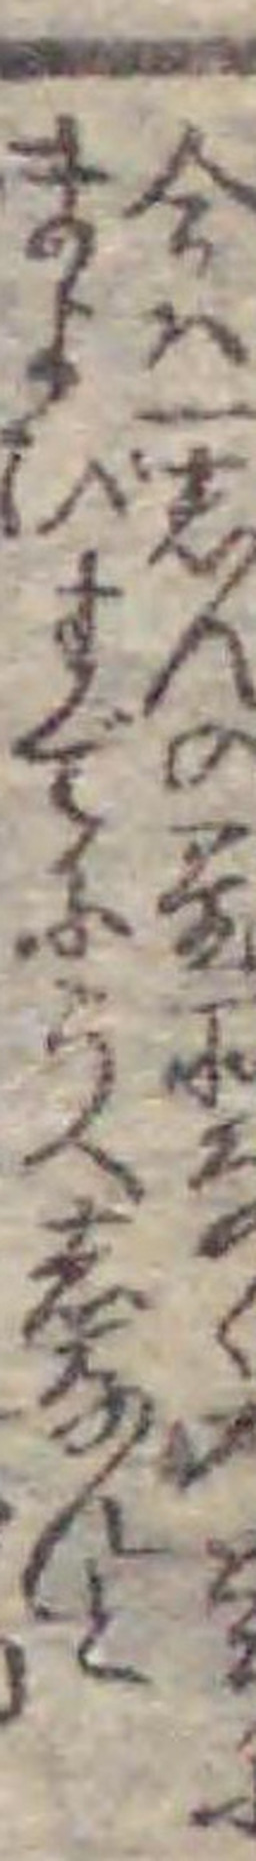まよひすでにうへしなんと
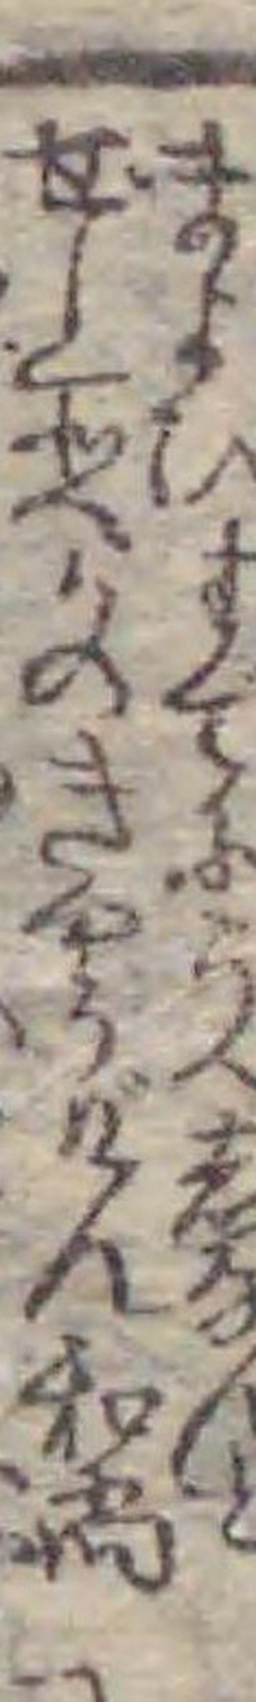せし所へかのきやうげん和尚
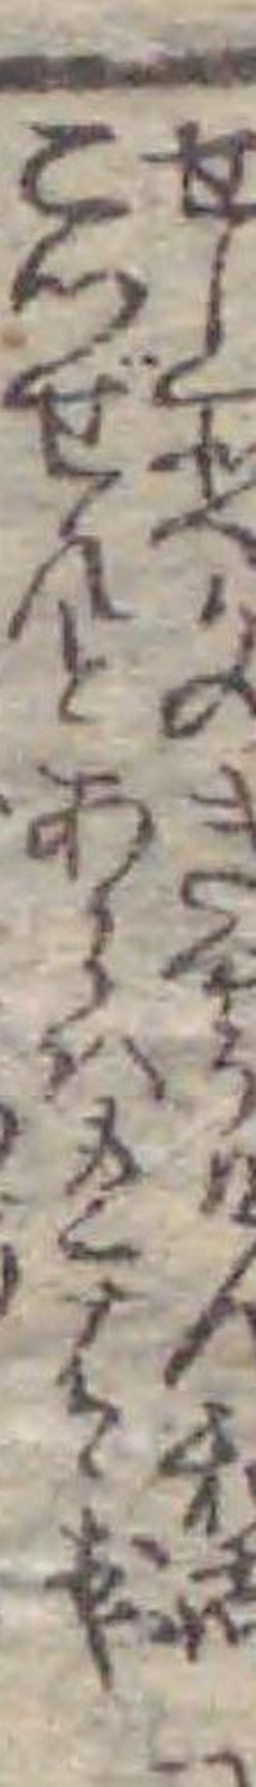こつぜんとあらはれはゝおや
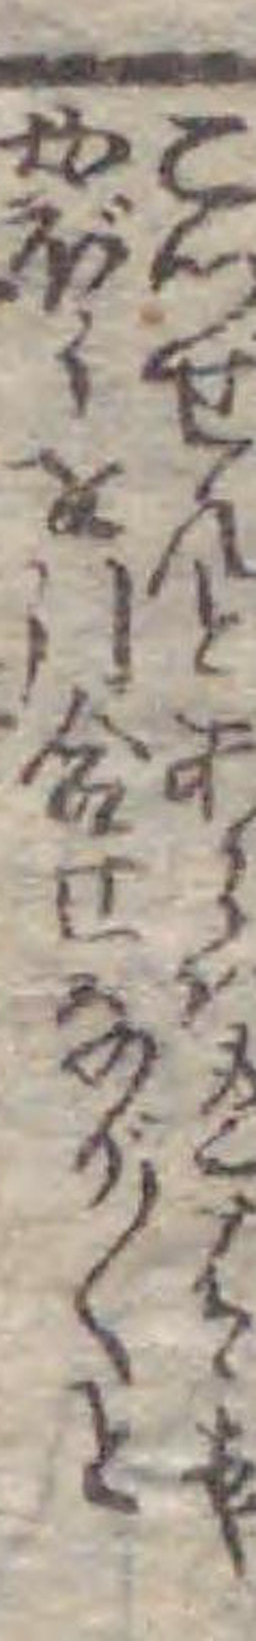女ぼうを引合せなが〳〵と
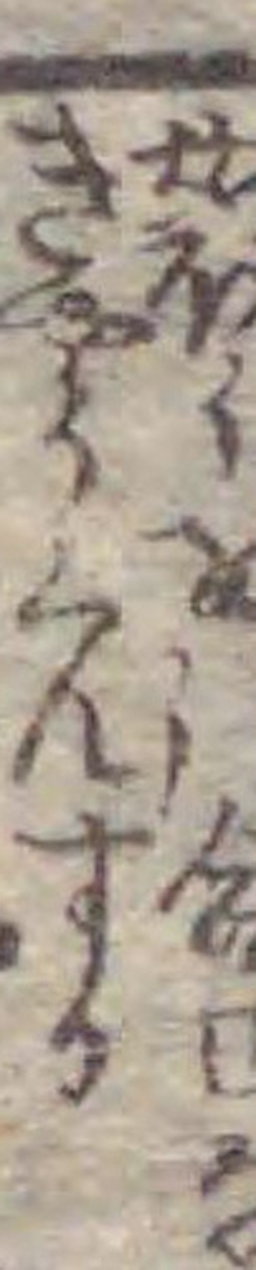きやうくんする
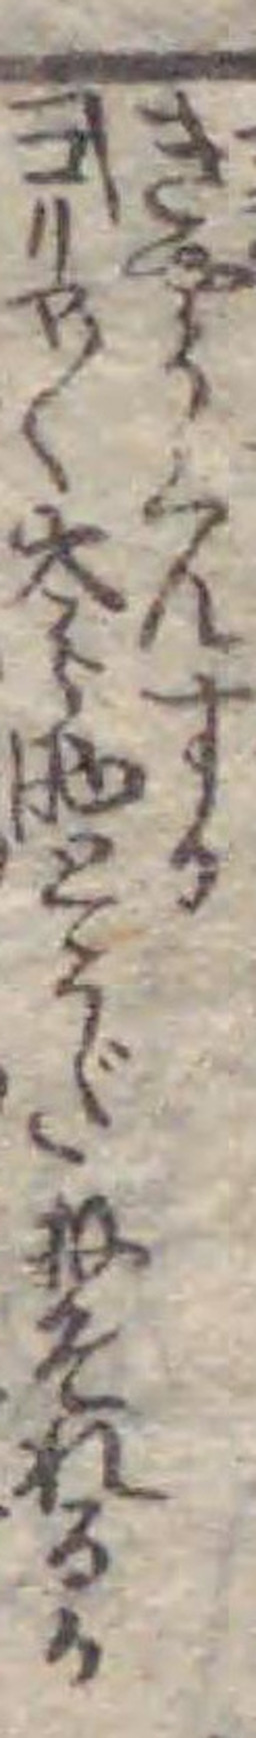〽コリヤ〳〵太郎助とうだおそれるか
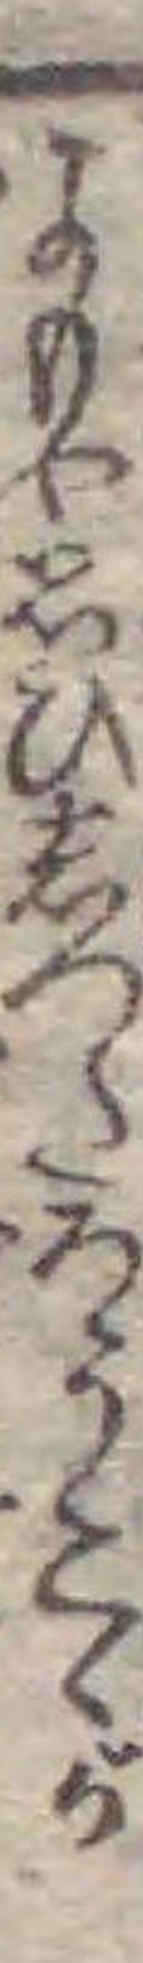よもや思ひしつたろうこゝが
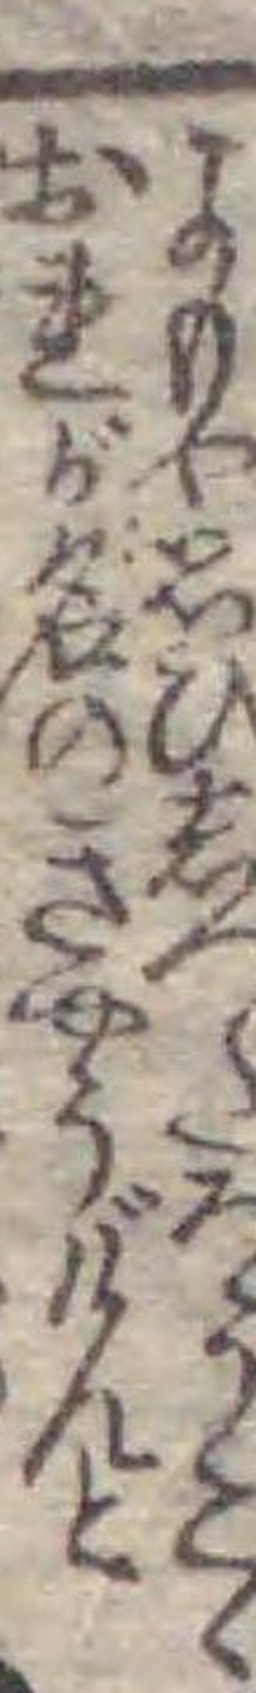おれが菜のきやうげんと
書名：四遍搨心学草帋 : 3巻
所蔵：国立国会図書館 National Diet Library, JAPAN
